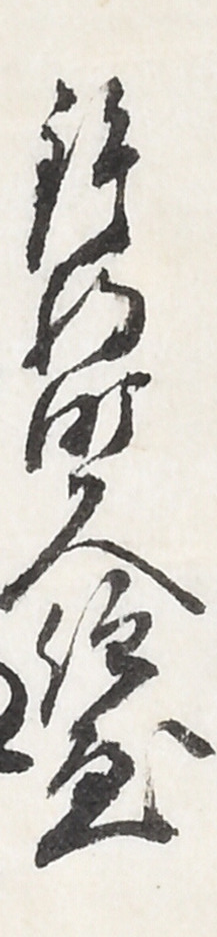鉾持町久住屋
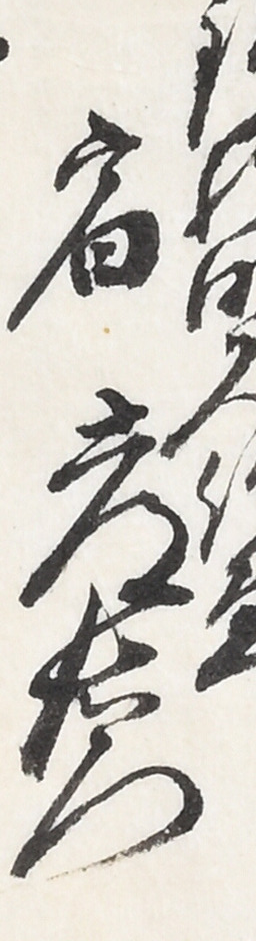宿常右衛門
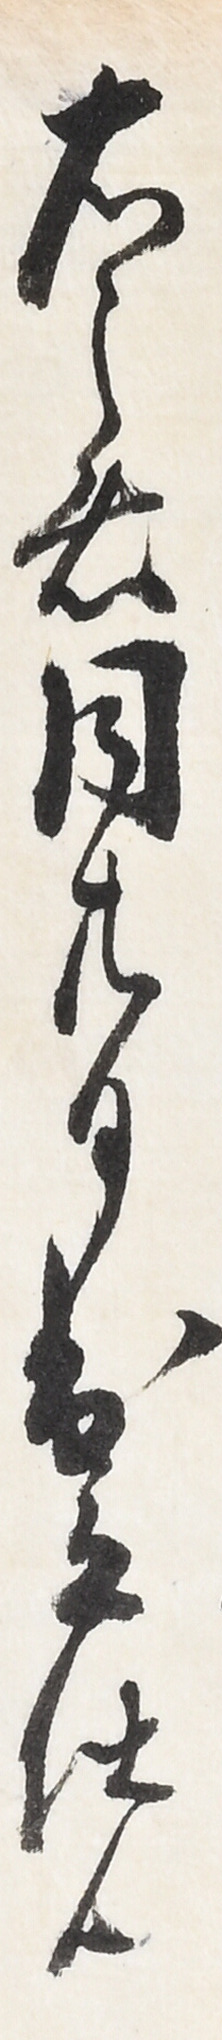右之者同廿日出立仕候
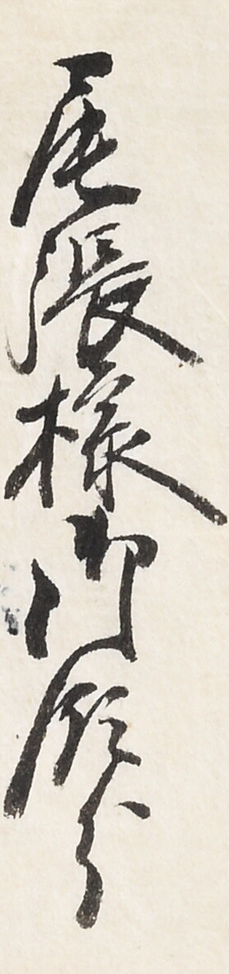尾張様御領分
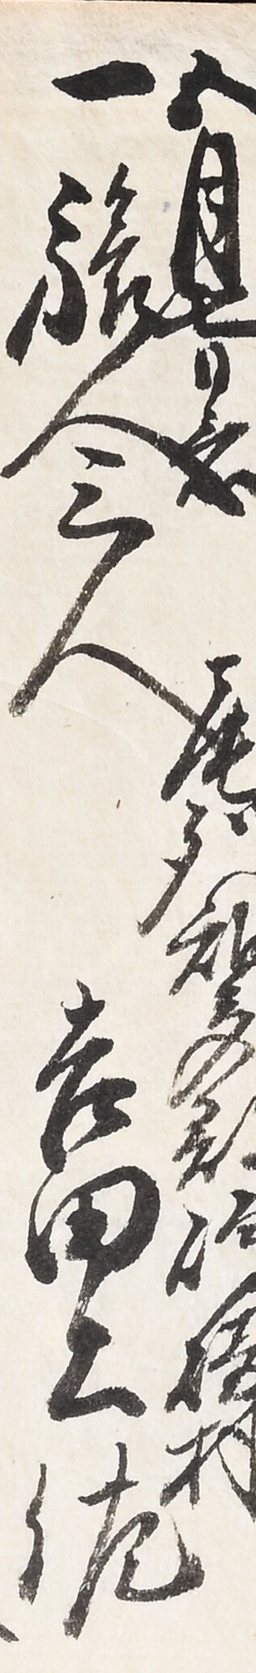一旅人三人吉田土佐
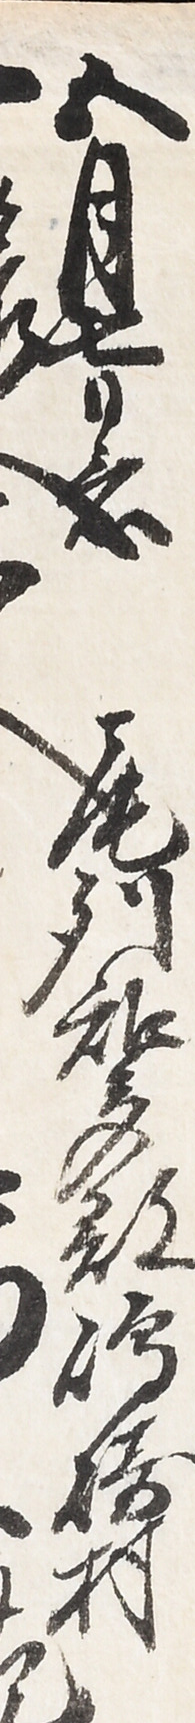五月七日着尾州知多郡嶋崎村
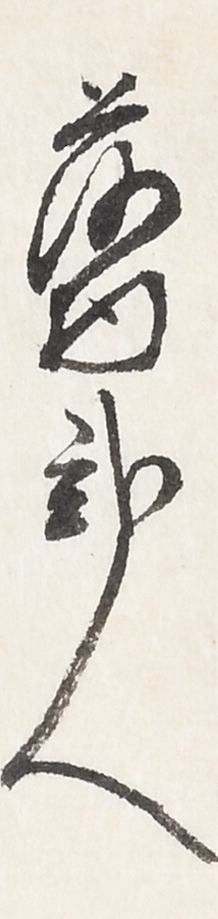荷持弐人
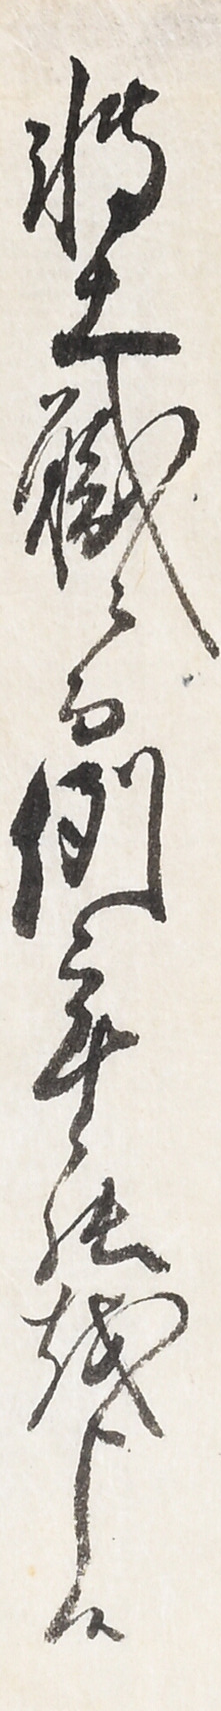転士職ニ而例年罷越申候
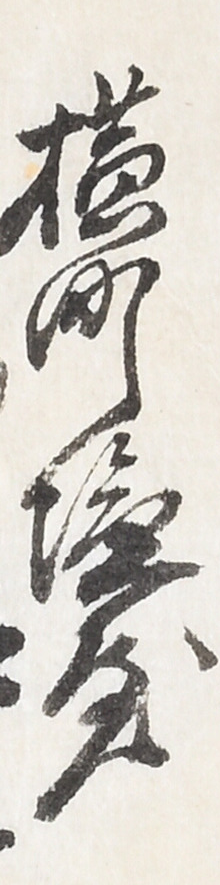横町塩屋
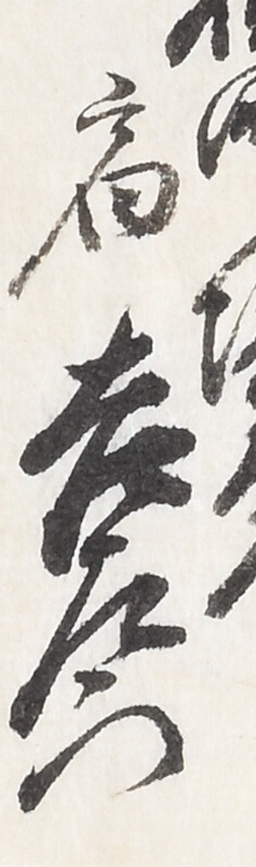宿吉左衛門
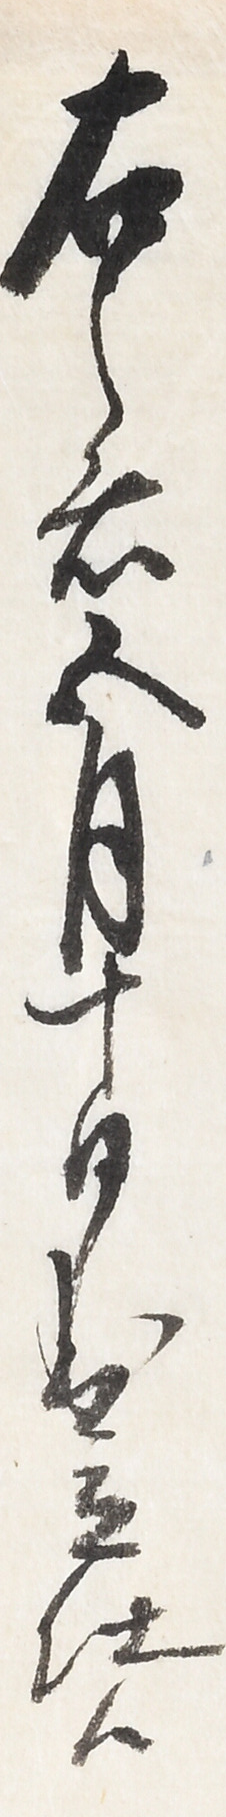右之者五月十日出立仕候
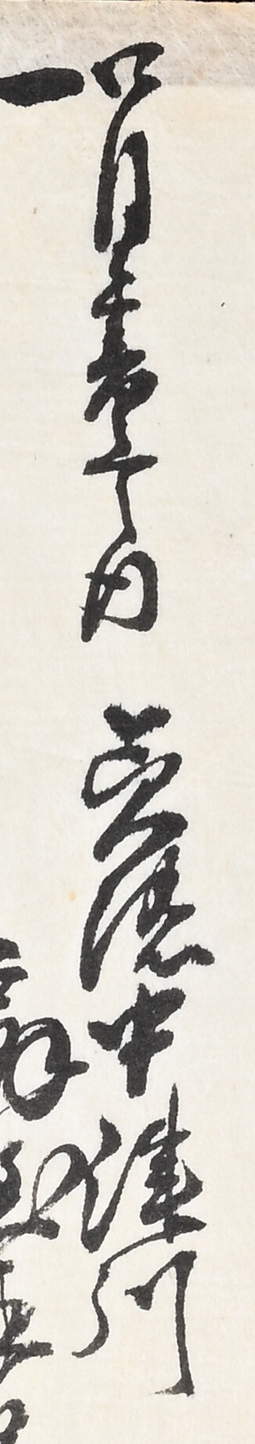四月書上之者美濃中津川
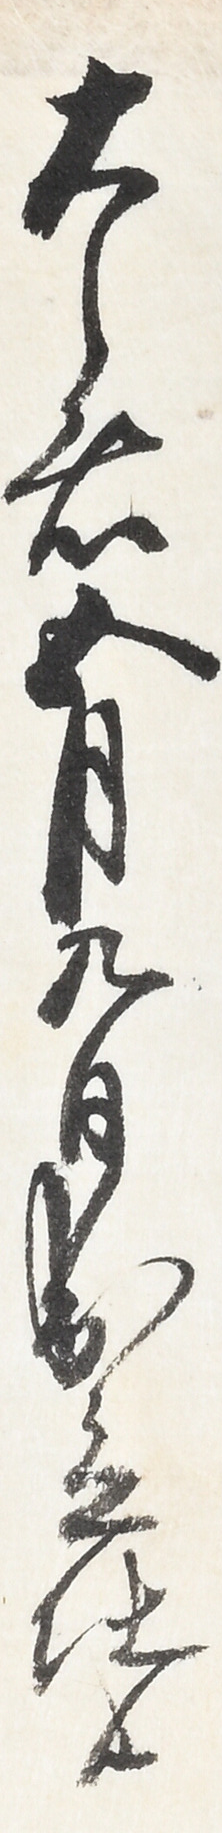右之者五月九日出立仕候
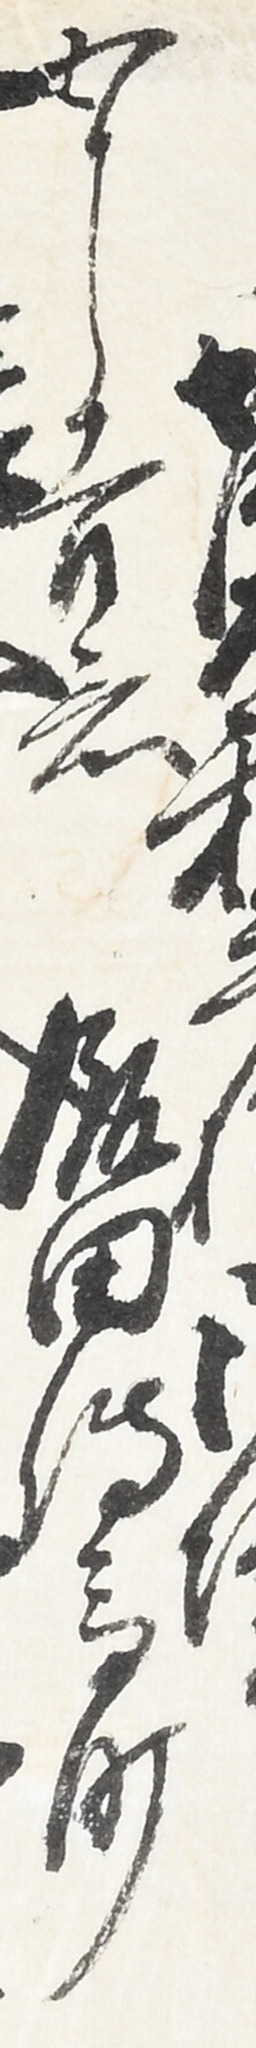五月十一日着飯田伝馬町
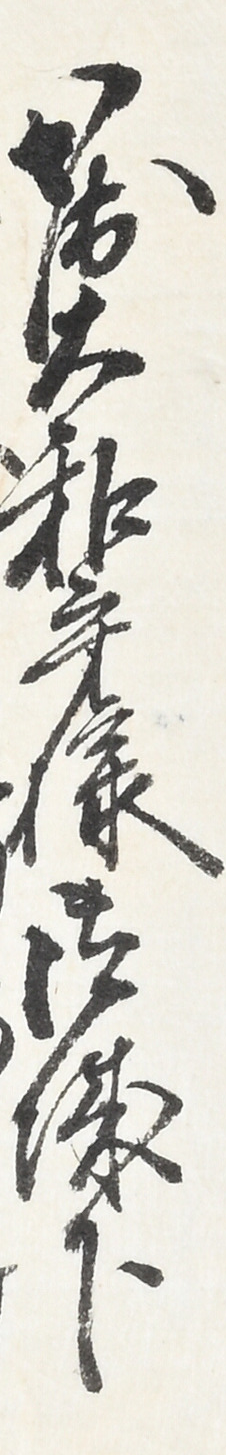堀大和守様御城下
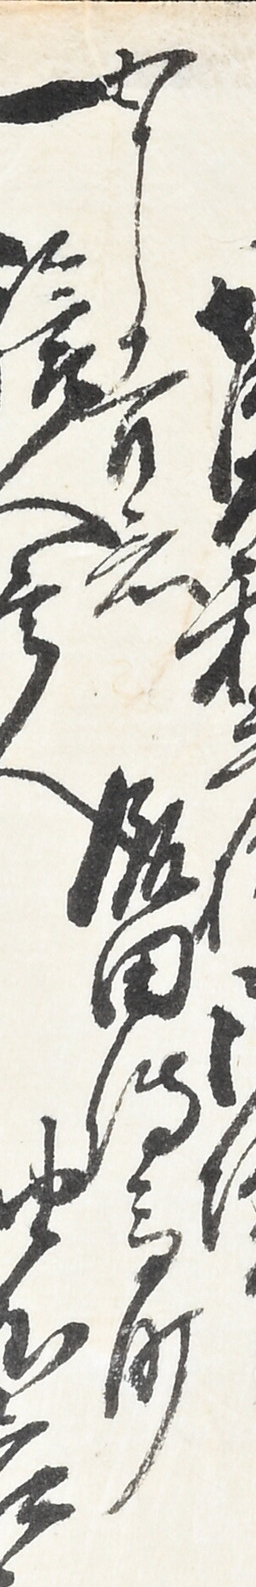五月十一日着飯田伝馬町
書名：旅人泊控帳
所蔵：伊那市立高遠町図書館・合同会社AMANE
